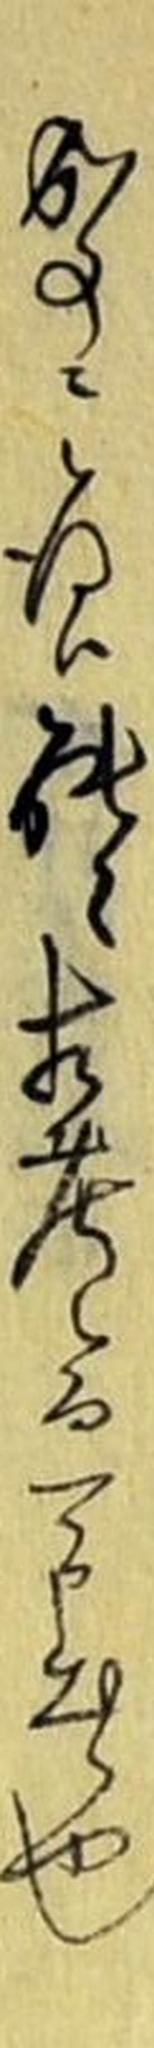成事に候得は能々相考候而可申出候也

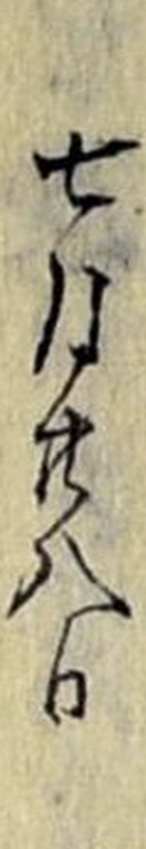七月廿八日
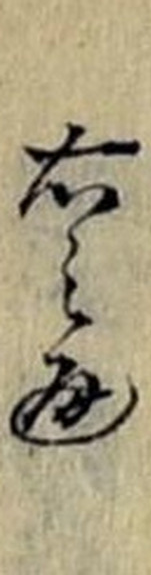右之通
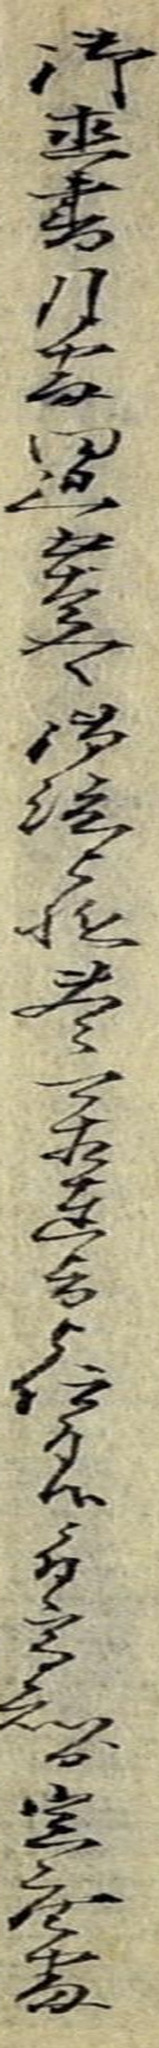御直書月番田辺五太夫へ御渡被遊夫々可相達旨被仰付候に付高知ゟ定座番
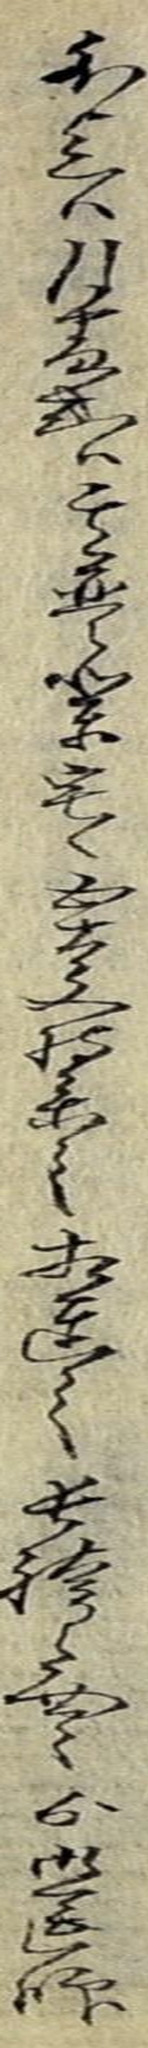外迄は月番或は其並之輩宅へ五太夫持参之相達之長袴之面々ゟ御医師
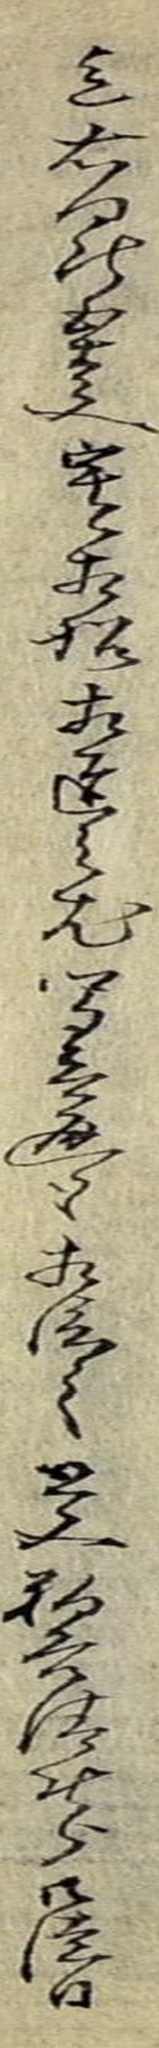迄右同断五太夫宅へ相招相達之尤写壱通つヽ相渡之且又粕谷清次郎御徒目
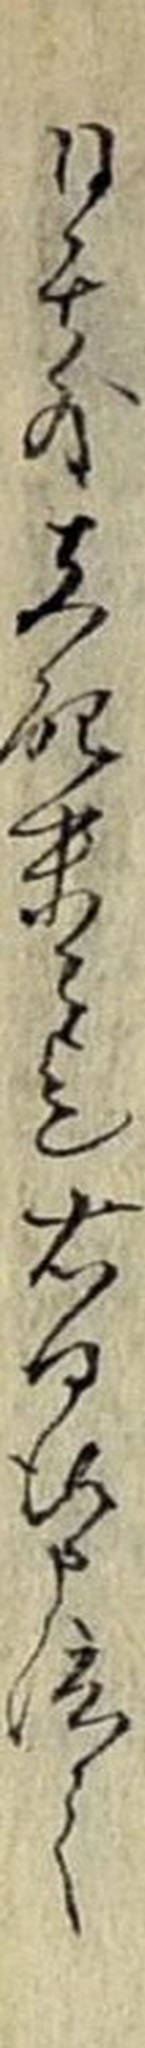付其外支配末々迄右同趣申渡之
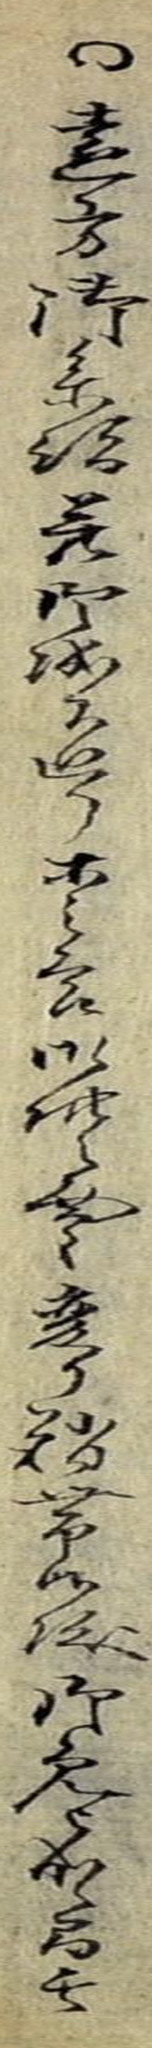○遠方御参詣并御城下廻り等之節御供之面々変り鞘帯候儀御免被成候間其
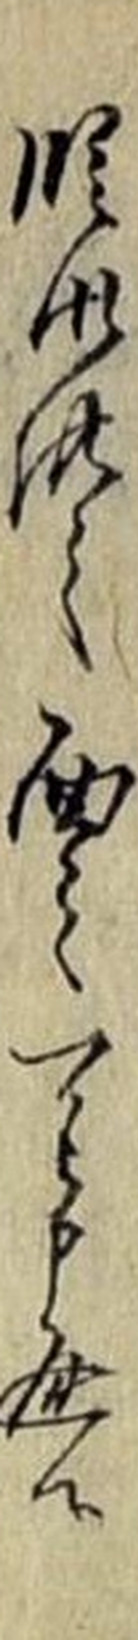段御供之面々可被申通候
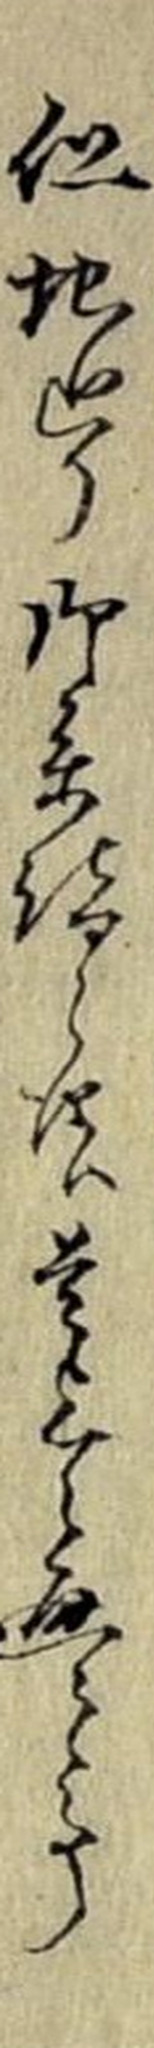但地廻り御参詣之儀は是迄之通候事
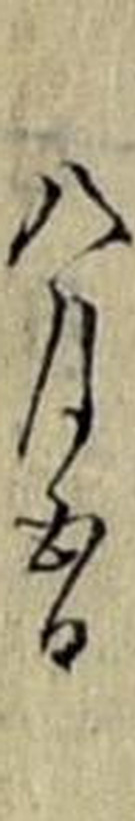八月五日
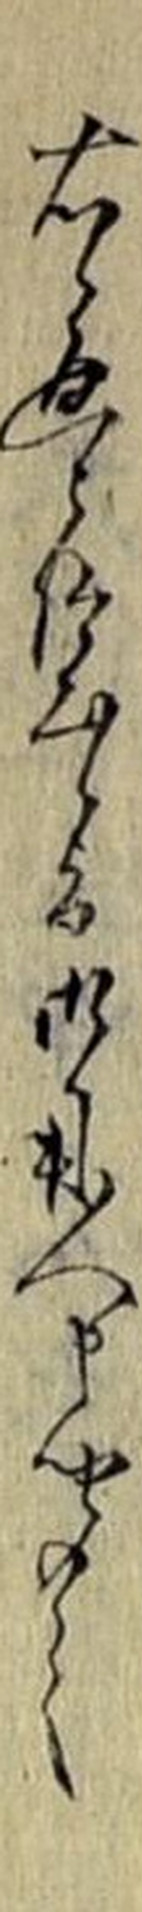右之通被仰出候旨御用人申聞之
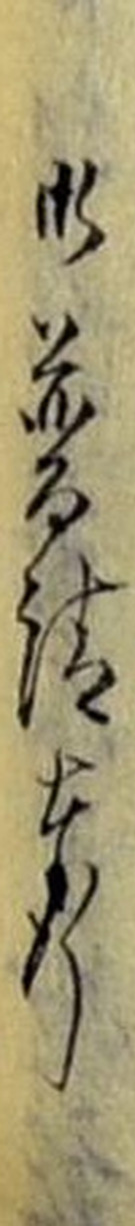御普請奉行
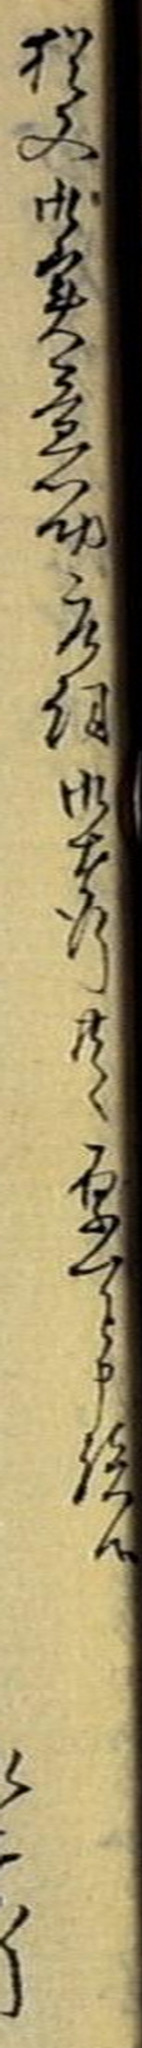猶又御実益筋取調御奉行共へ厚可被申渡候
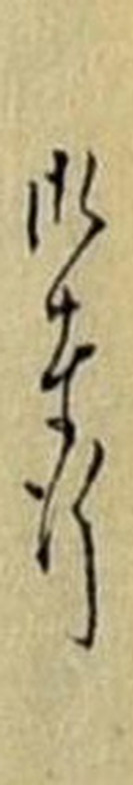御奉行
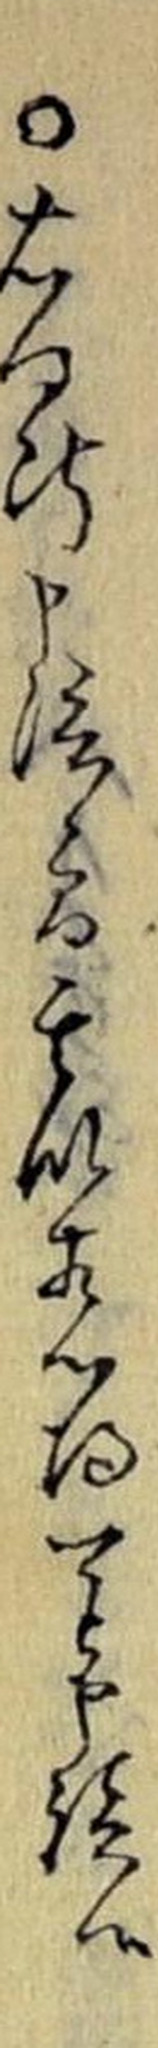○右同断申渡候間其段相心得可被申談候
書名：命令之部 六
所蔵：福井県文書館 Fukui Prefectural Archives
